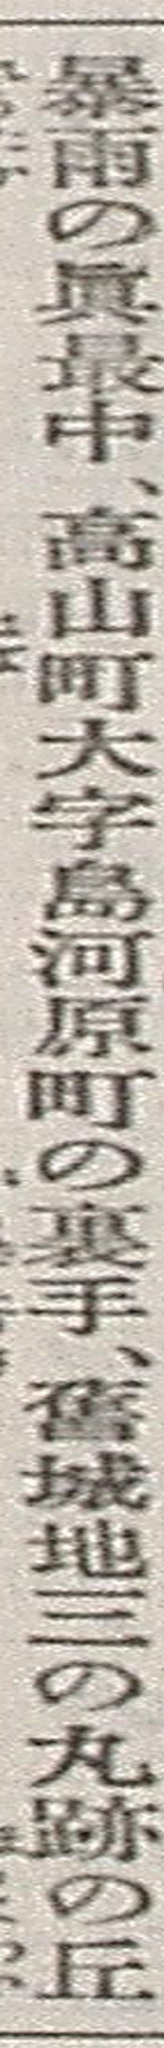暴雨の真最中、高山町大字島河原町の裏手、旧城地三の丸跡の丘
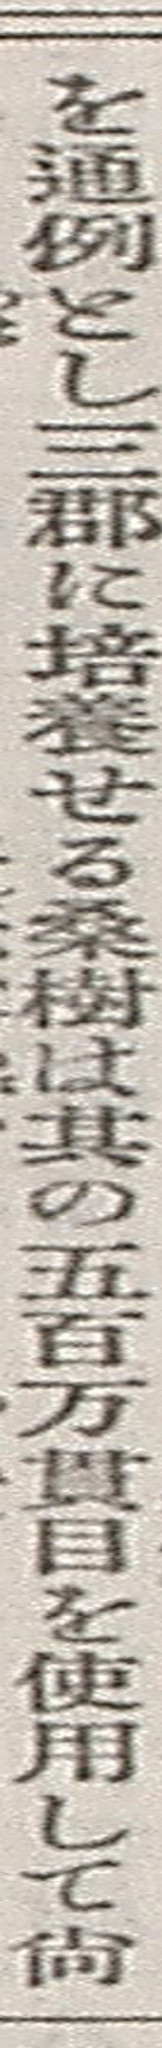を通例とし三郡に培養せる桑樹は其の五百万貫目を使用して尚
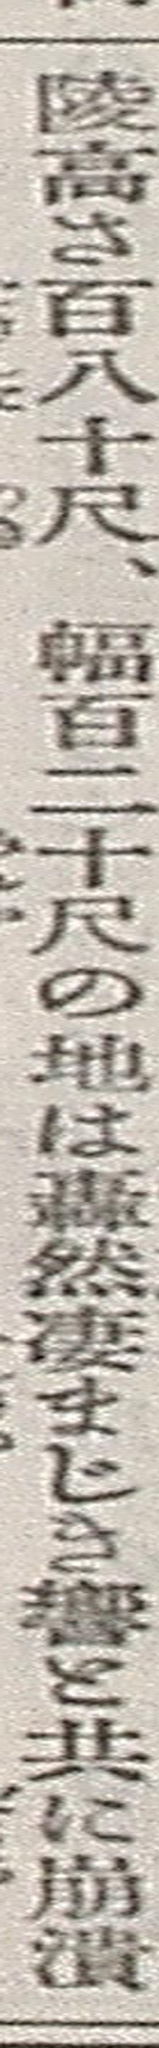陵高さ百八十尺、幅百二十尺の地は轟然凄まじき響と共に崩潰
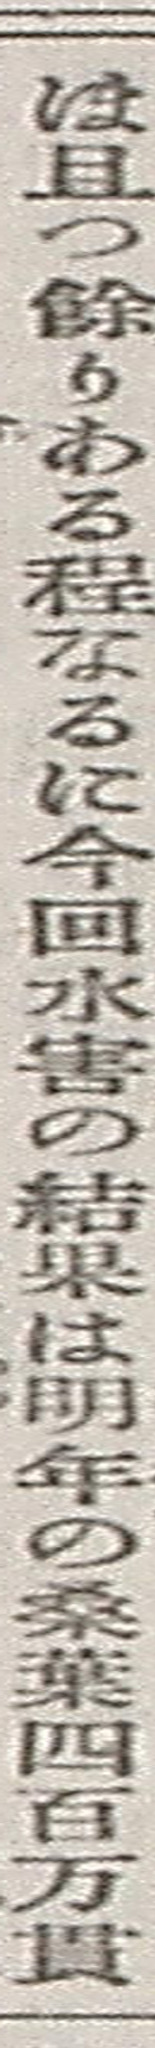ほ且つ餘りある程なるに今回水害の結果は明年の桑葉四百万貫
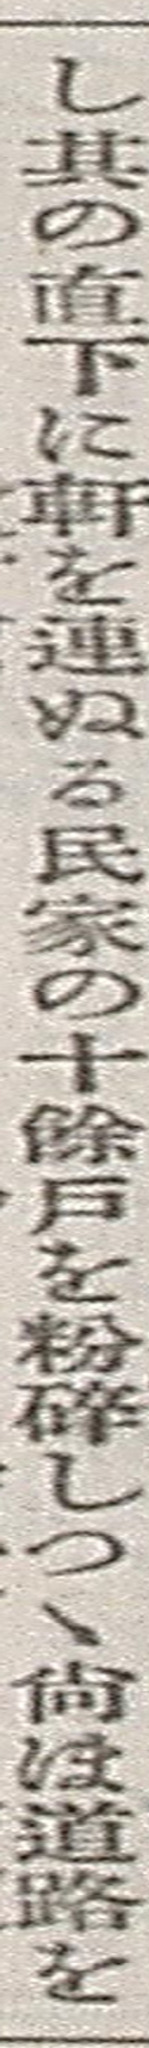し其の直下に軒を連ぬる民家の十餘戸を粉砕しつゝ尚ほ道路を
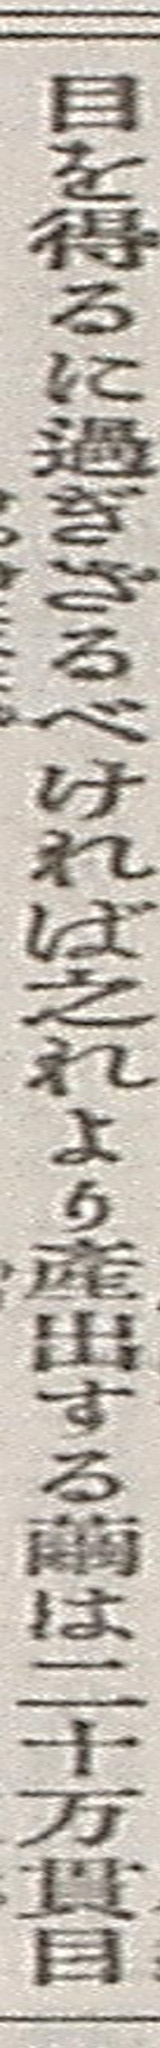目を得るに過ぎざるべければ之れより産出する繭は二十万貫目
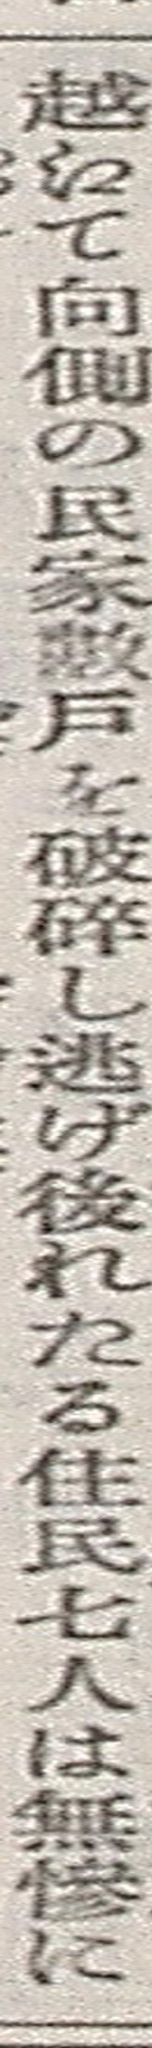越えて向側の民家数戸を破砕し逃げ後れたる住民七人は無惨に
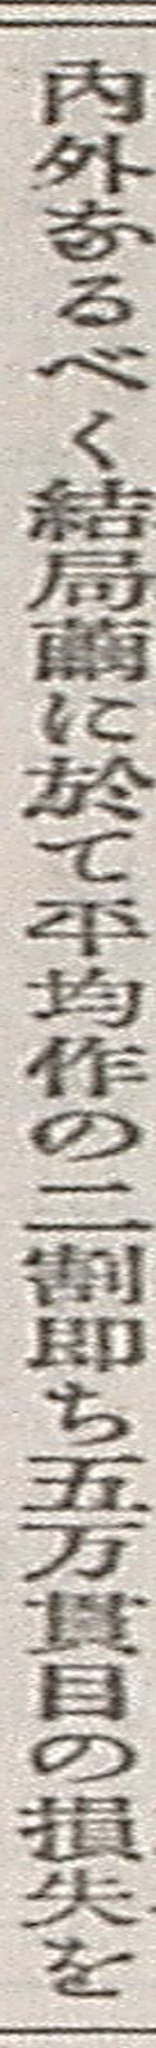内外なるべく結局繭に於て平均作の二割即ち五万貫目の損失を
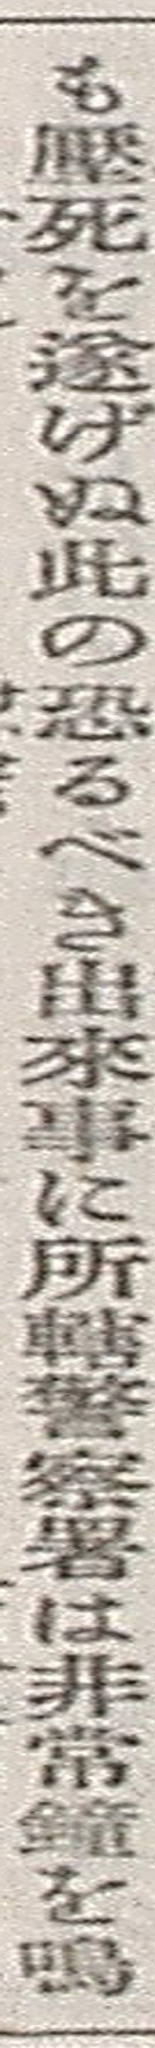も壓死を遂げぬ此の恐るべき出来事に所轄警察署は非常鐘を鳴
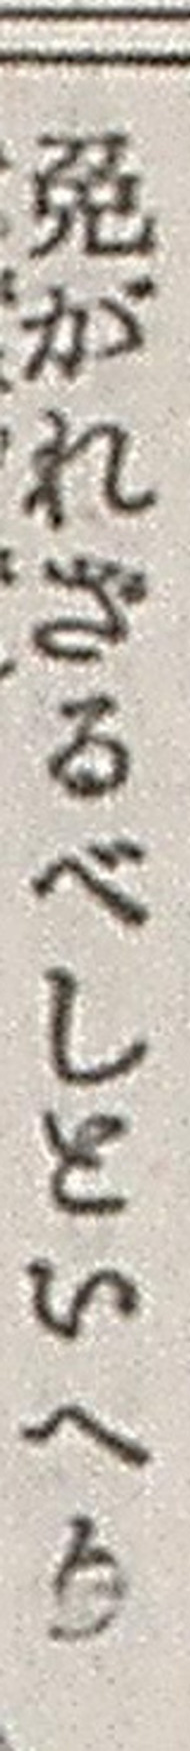免がれざるべしといへり
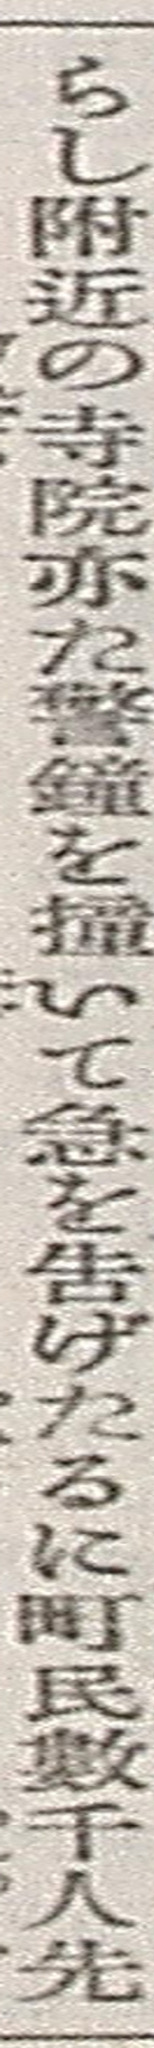らし附近の寺院亦た警鐘を撞いて急を告げたるに町民数千人先
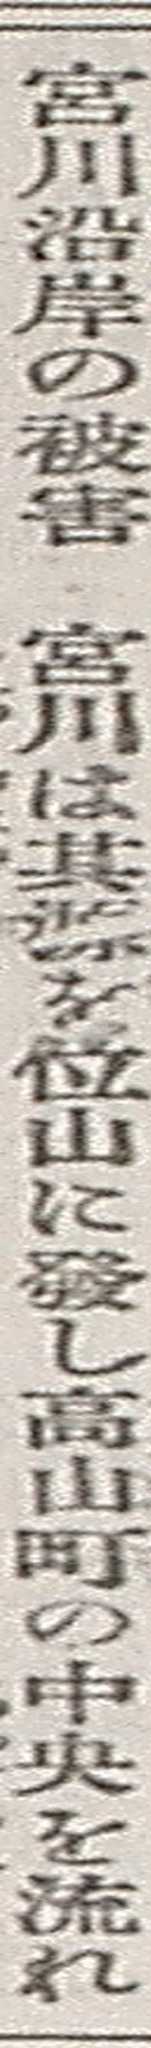宮川沿岸の被害宮川は其源を位山に発し高山町の中央を流れ
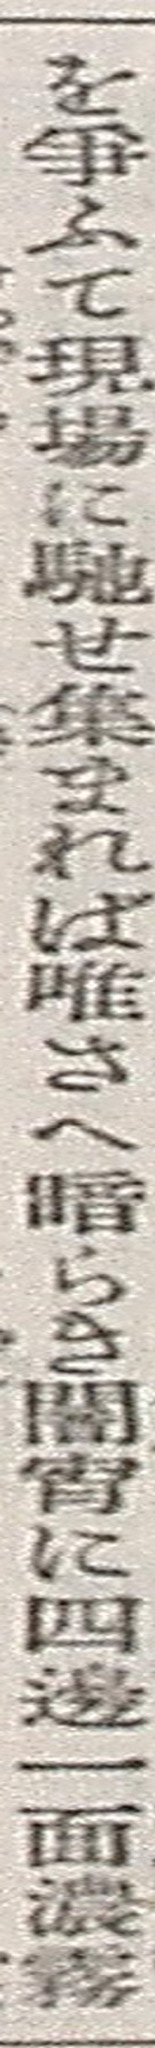を争ふて現場に馳せ集まれば唯さへ暗らき闇夜に四辺一面濃霧
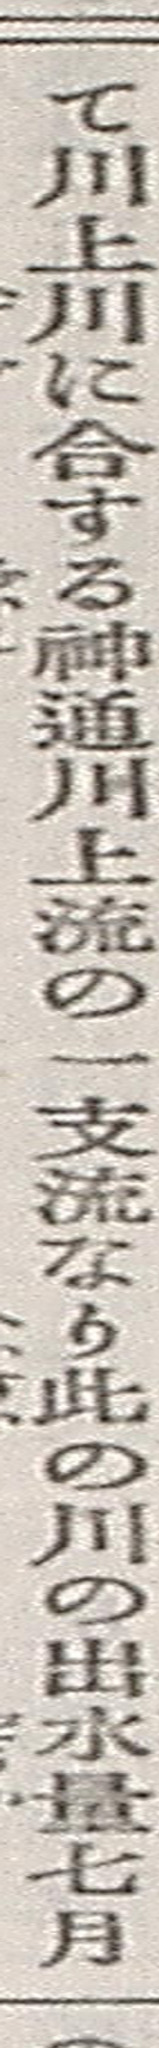て川上川に合する神通川上流の一支流なり此の川の出水量七月
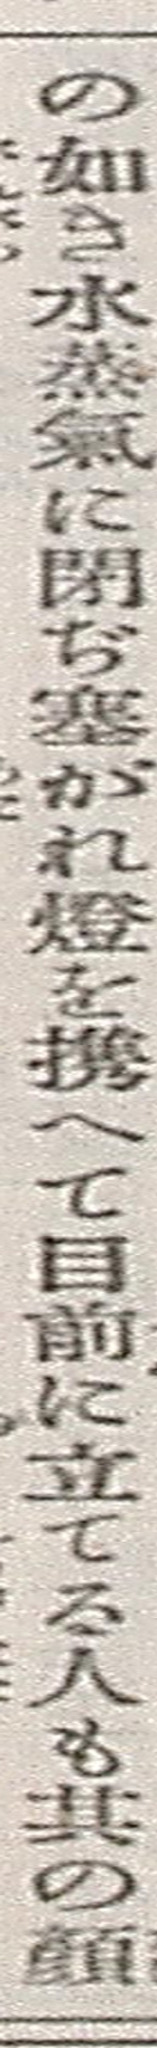の如き水蒸気に閉ぢ塞がれ燈を携へて目前に立てる人も其の顔
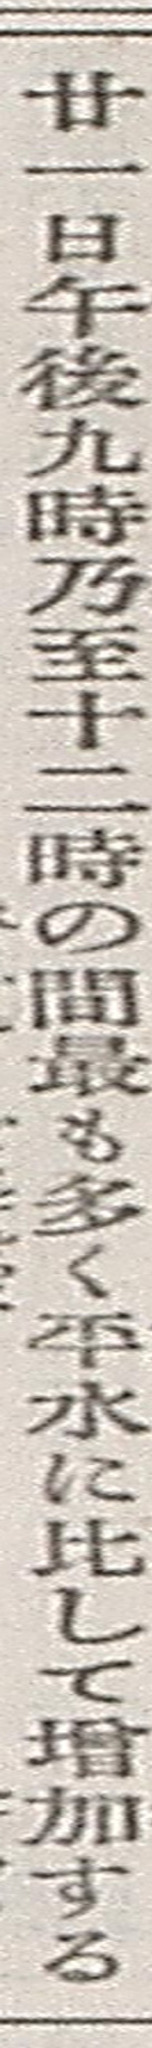廿一日午後九時乃至十二時の間最も多く平水に比して増加する
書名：風俗畫報臨時増刊第百二十八號　洪水被害録（下）
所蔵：東京大学地震研究所図書室 Earthquake Research Institute Library, The University of Tokyo, JAPAN
